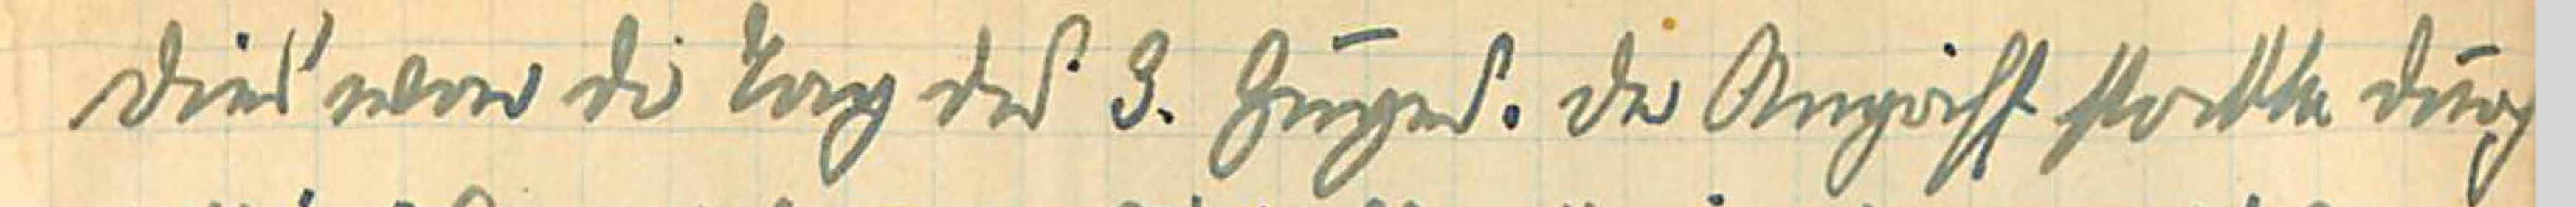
Dies war der Tag des 3. Zuges. Der Angriff stockte durch
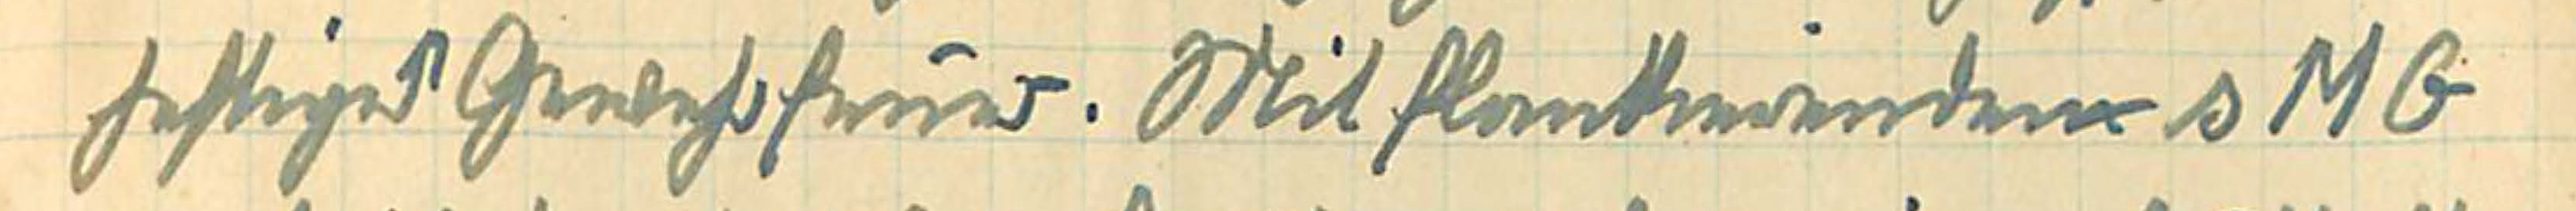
heftiges Gewehrfeuer. Mit flankierenden s MG
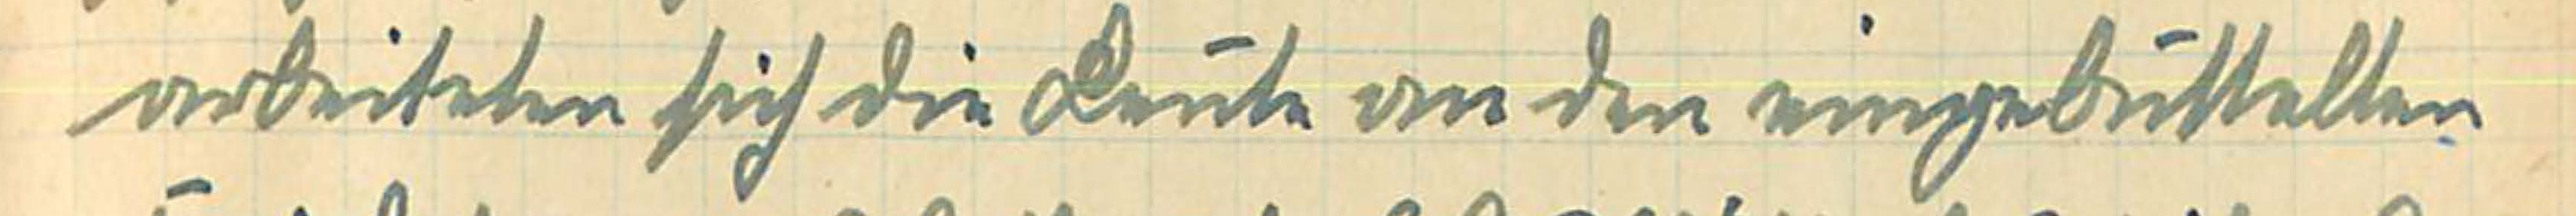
arbeiteten sich die Leute an den eingebuttelten
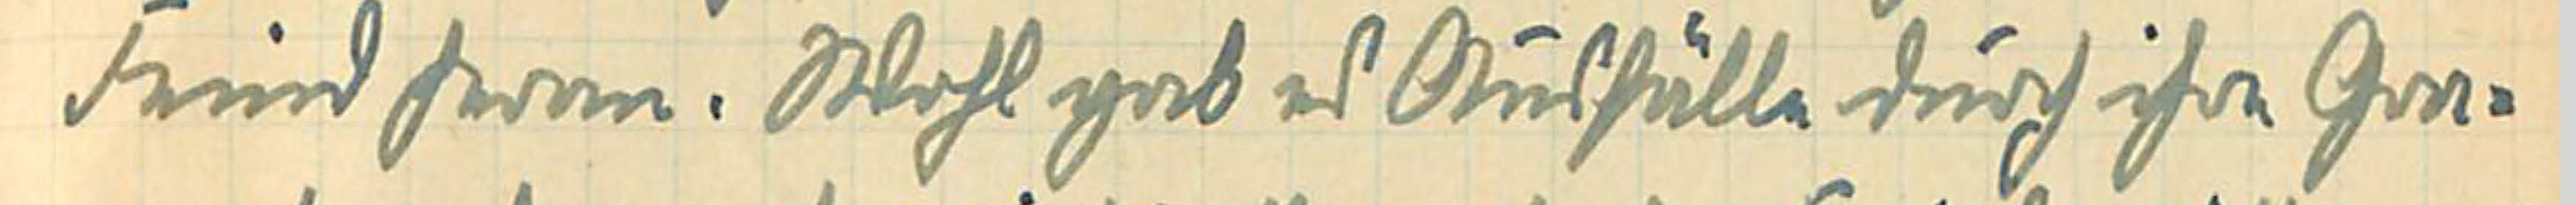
Feind heran. Wohl gab es Ausfälle durch ihre Gra-
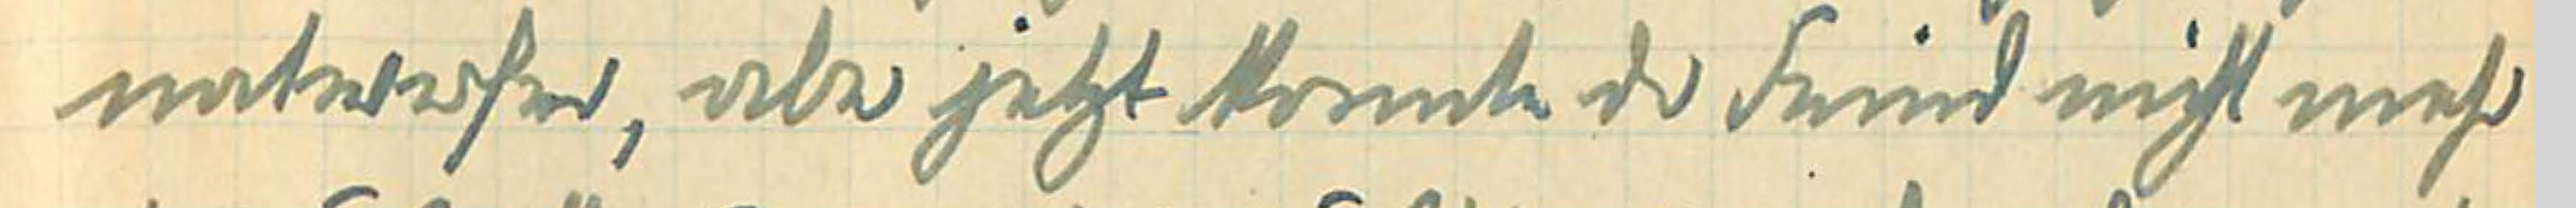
natwerfer, aber jetzt konnte der Feind nicht mehr
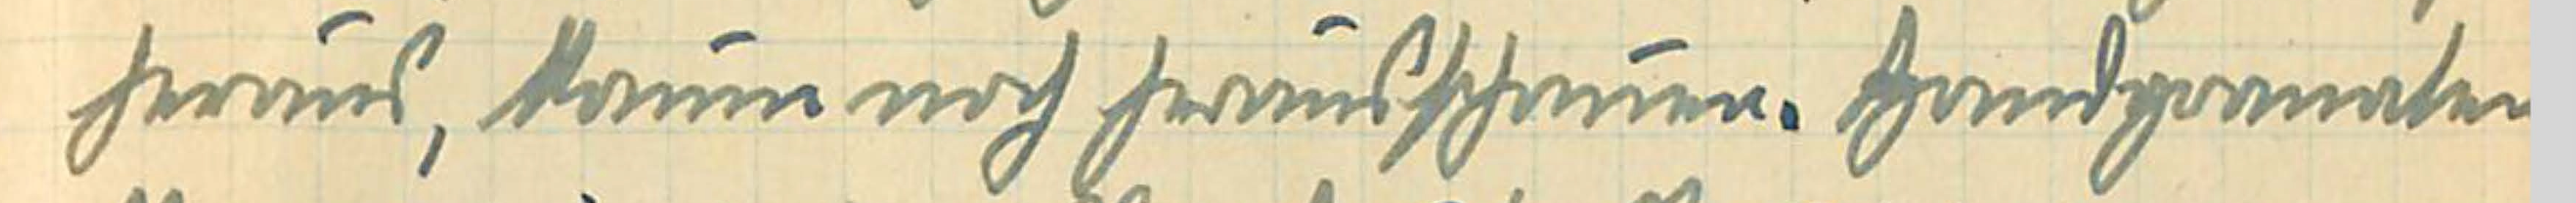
heraus, kaum noch herausschauen. Handgranaten
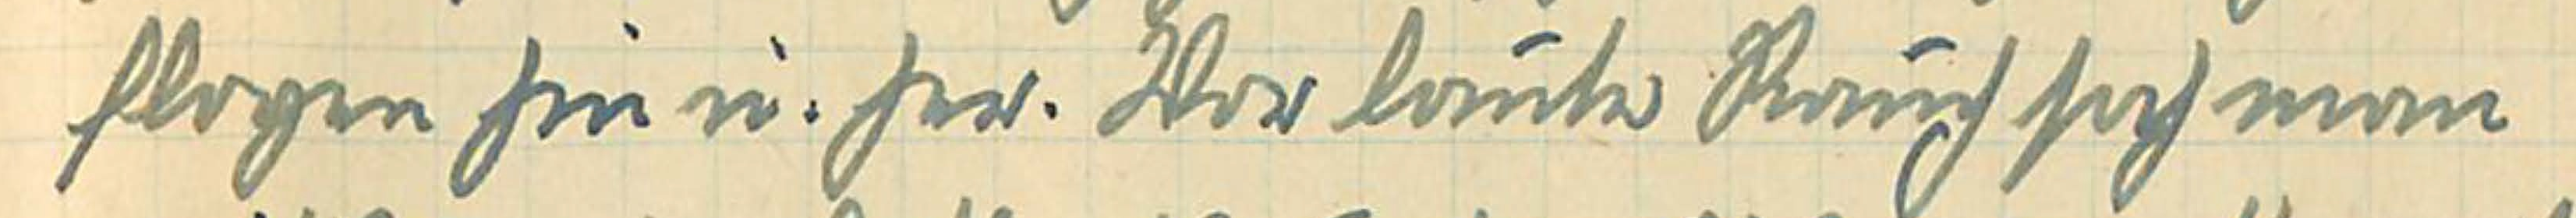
flogen hin u. her. Vor lauter Rauch sah man
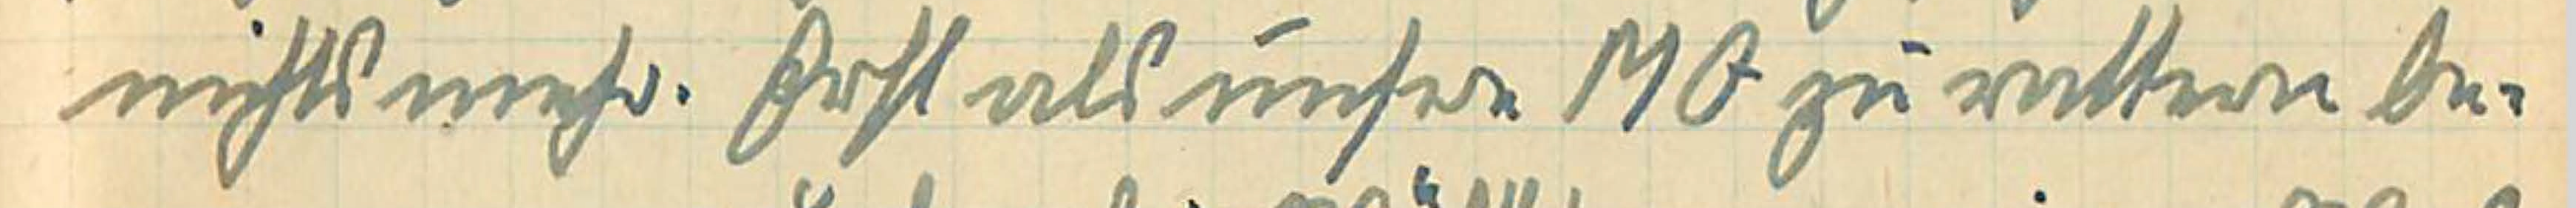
nichts mehr. Erst als unsere MG zu rattern be-
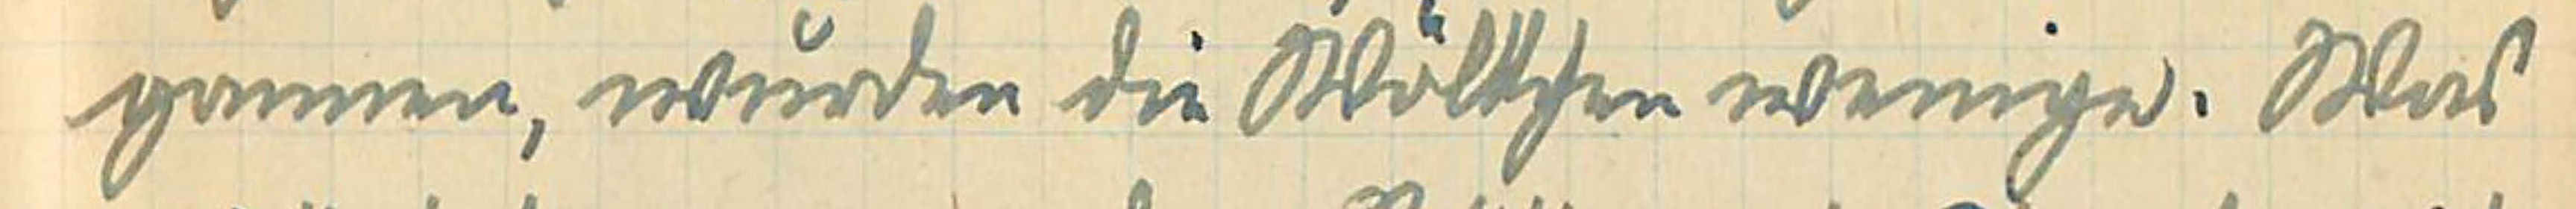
gannen, wurden die Wölkchen weniger. Was
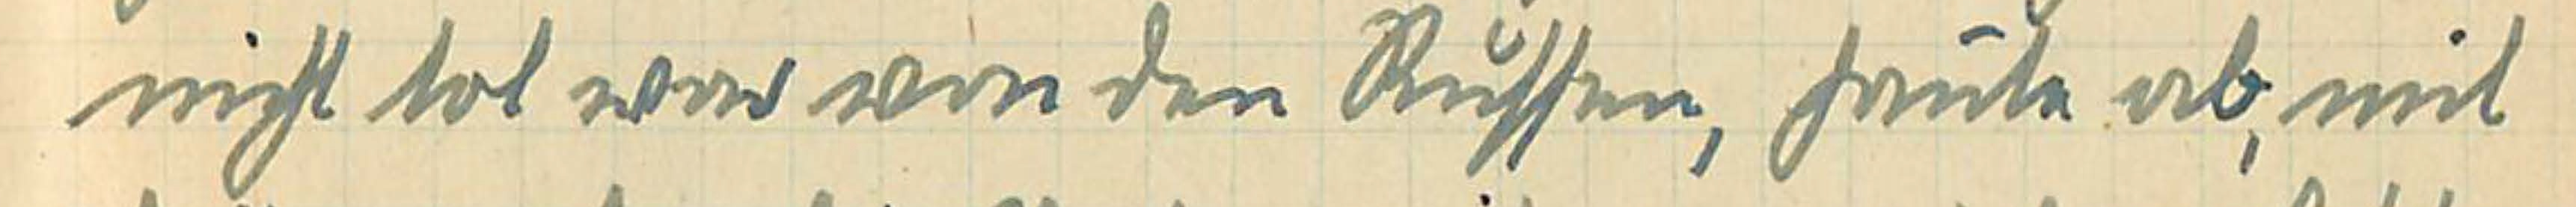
nicht tot war von den Russen, haute ab, mit
